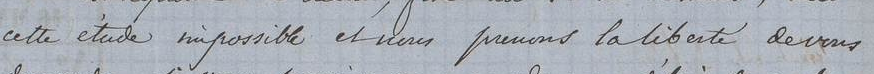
cette étude impossible et nous prenons la liberté de vous
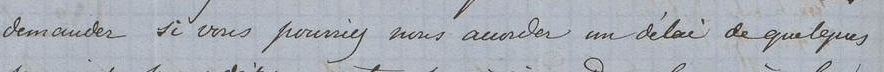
demander si vous pourriez nous accorder un délai de quelques
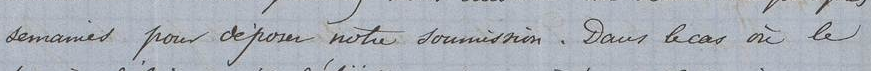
semaines pour déposer notre soumission. Dans le cas où le
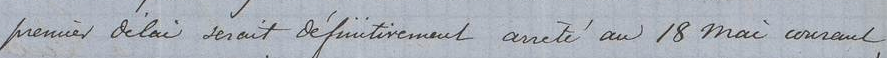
premier délai serait définitivement arrêté au 18 Mai courant,
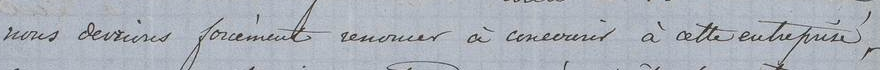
nous devrions forcément renoncer à concourir à cette entreprise,
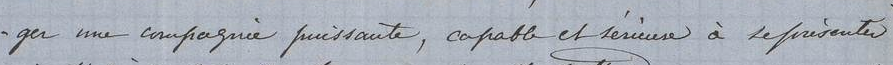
ger une compagnie puissante, capable et sérieuse à représenter
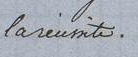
la réussite.
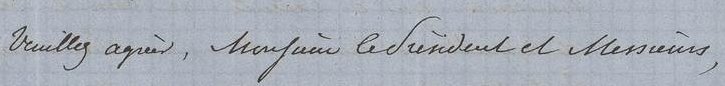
Veuillez agréer, Monsieur le Président et Messieurs,
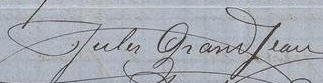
Jules Grandjean
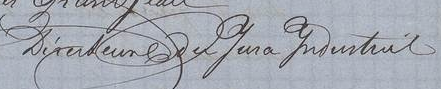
Directeur du Jura Industriel
